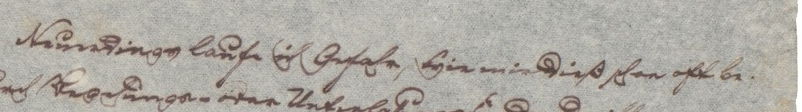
Neuerdings laufe ich Gefahr, wie mir dieß schon oft be-
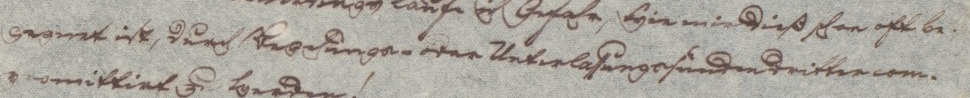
gegnet ist, durch Begehungs- oder Unterlassungssünden Dritter com-
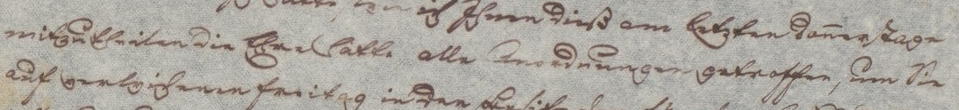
mitzutheilen die Ehre hatte, alle Anordnungen getroffen, um Sie
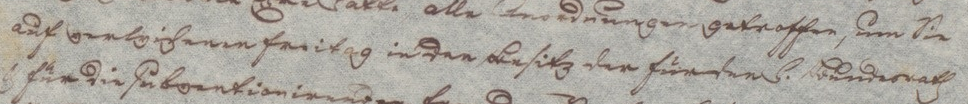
auf verwichenen Freitag in den Besitz der für den H. Bundesrath
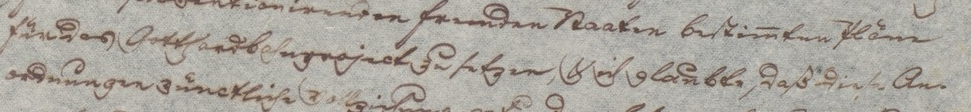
für das Gotthardbahnproject zu setzen, & ich glaubte, daß diese An-
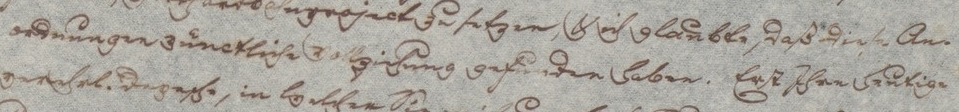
ordnungen pünctliche Vollziehung gefunden haben. Erst Ihre heutige
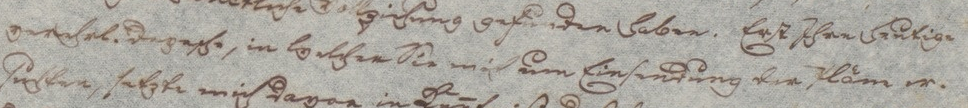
verehrl. Depesche, in welcher Sie mich um Einsendung der Pläne er-
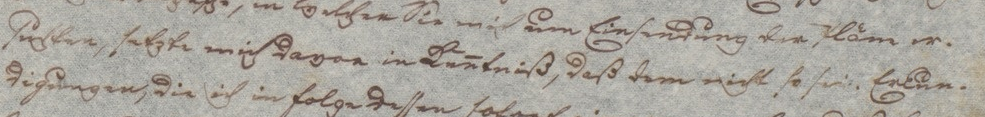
suchten, setzte mich davon in Kenntniß, daß dem nicht so sei. Erkun-
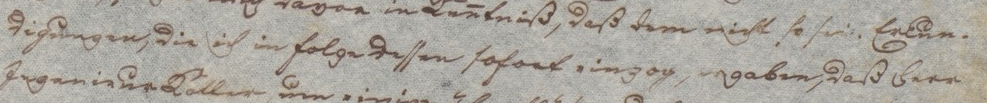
digungen, die ich in Folge dessen sofort einzog, ergaben, daß Herr
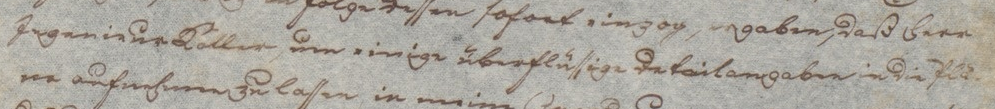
Ingenieur Koller, um einige überflüssige Detailangaben in die
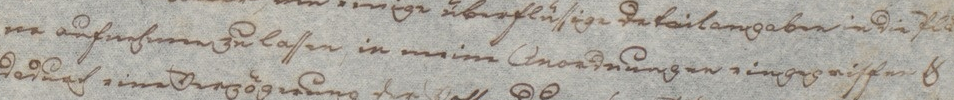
ne aufnehmen zu lassen, in meine Anordnungen eingegriffen &
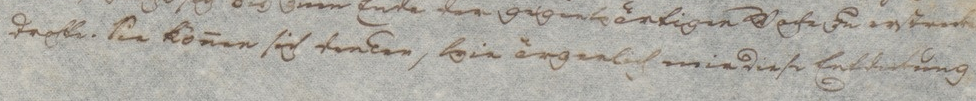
drohte. Sie können sich denken, wie ärgerlich mir diese
